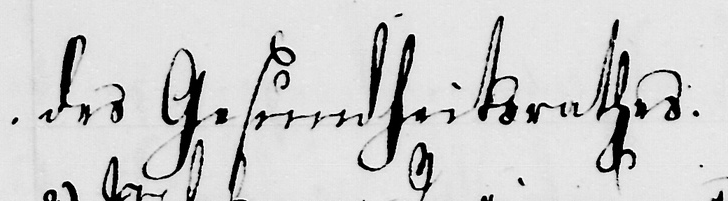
des Gesundheitsrathes.
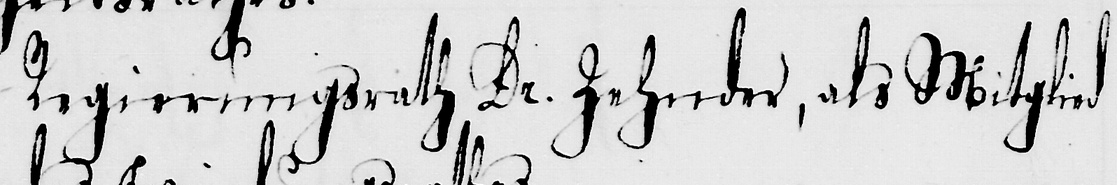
Regierungsrath Dr. Zehnder, als Mitglied
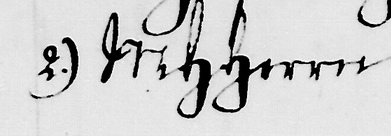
2.) MHHerrn
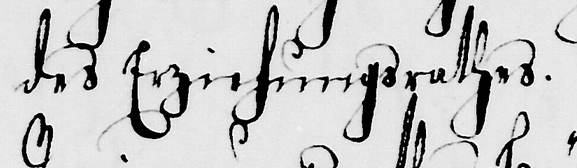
des Erziehungsrathes.
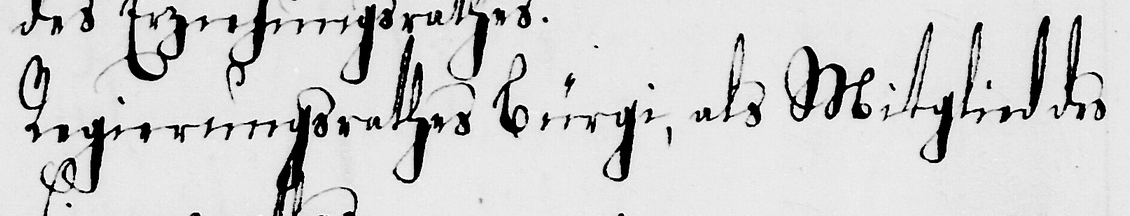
Regierungsrathes Bürgi, als Mitglied des
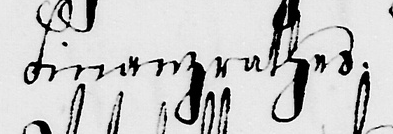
Finanzrathes.
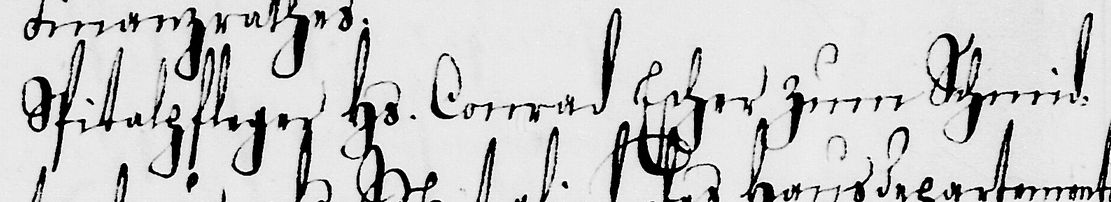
Spitalpfleger Hs. Conrad Escher zum Schmid¬
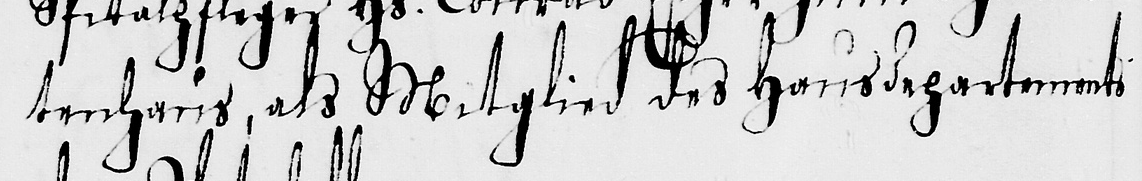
tenhaus, als Mitglied des Hausdepartements
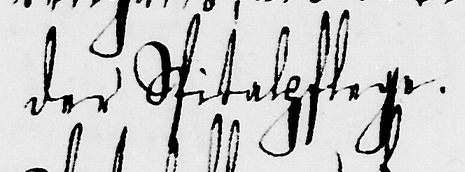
der Spitalpfle¬
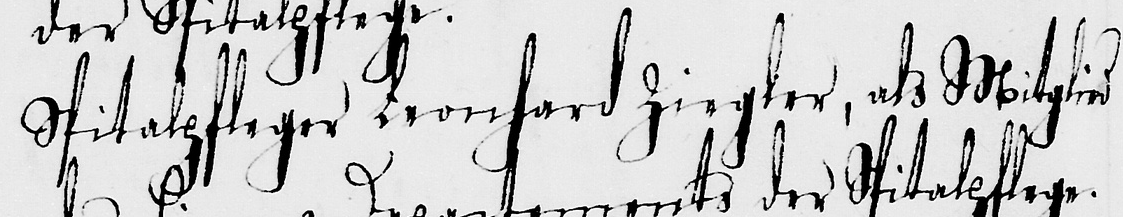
Spitalpfleger Leonhard Ziegler, als Mitglied
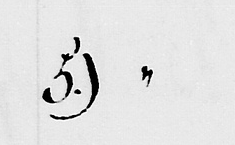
5.) “
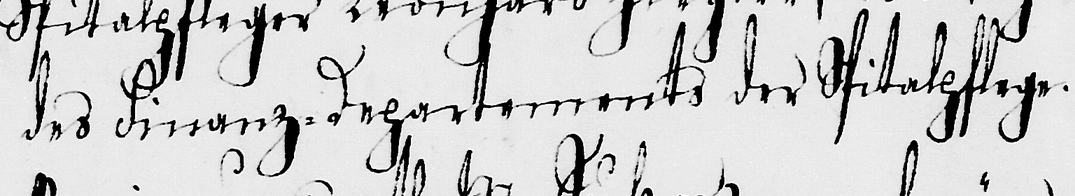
des Finanz-Departements der Spitalpflege.
